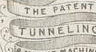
London
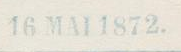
14th May 187 2
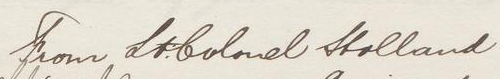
From Lt. Colonel Holland
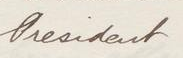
President
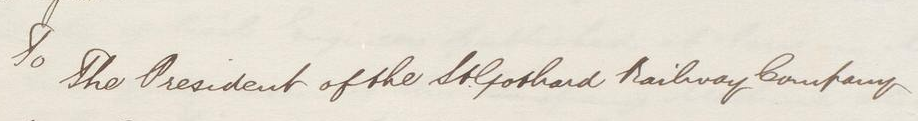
To The President of the St. Gothard Railway Company
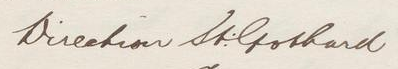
Direction St. Gothard
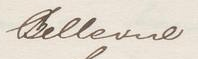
Bellevue
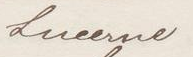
Lucerne
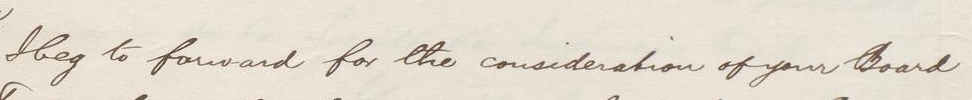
I beg to forward for the consideration of your Board
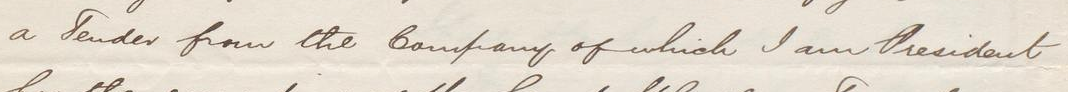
a Tender from the Company of which I am President
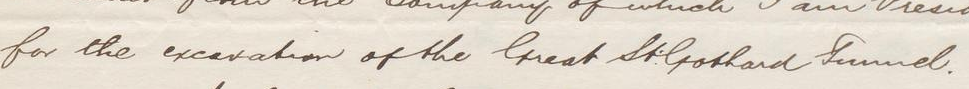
for the excavation of the Great St. Gothard Tunnel.
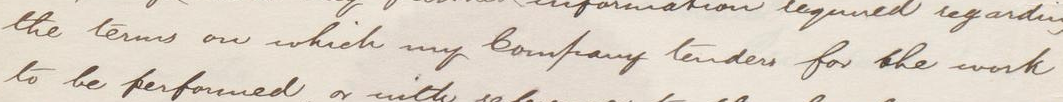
the terms on which my Company tenders for the work
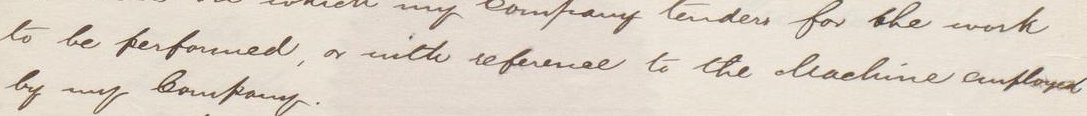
to be performed, or with reference to the Machine employed
